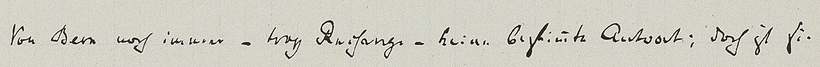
Von Bern noch immer – troz Rechange – keine bestimmt Antwort; doch ist sie
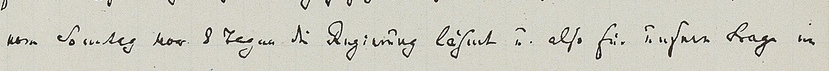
vom Sonntag vor 8 Tagen die Regierung lähmt u. also für unsere Frage im
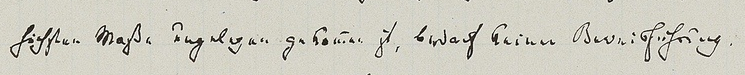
höchsten Maße ungelegen gekommen ist, bedarf keiner Beweisführung.
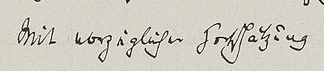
Mit vorzüglicher Hochschätzung
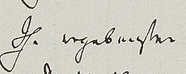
Ihr ergebenster
